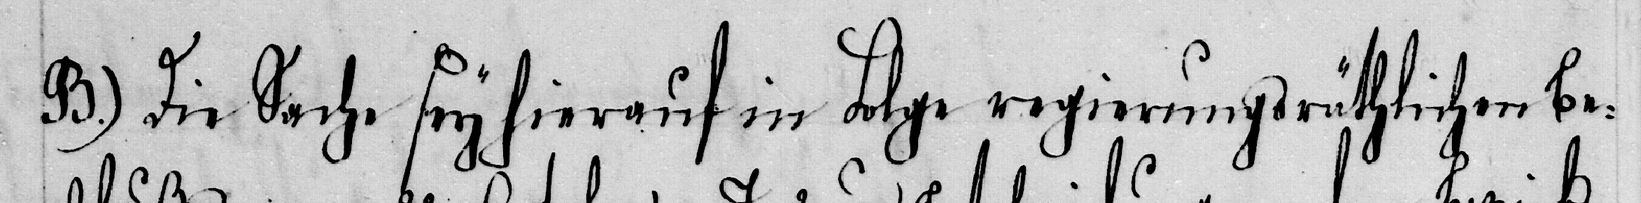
B.) Die Sache sey hierauf in Folge regierungsräthlichen Be¬
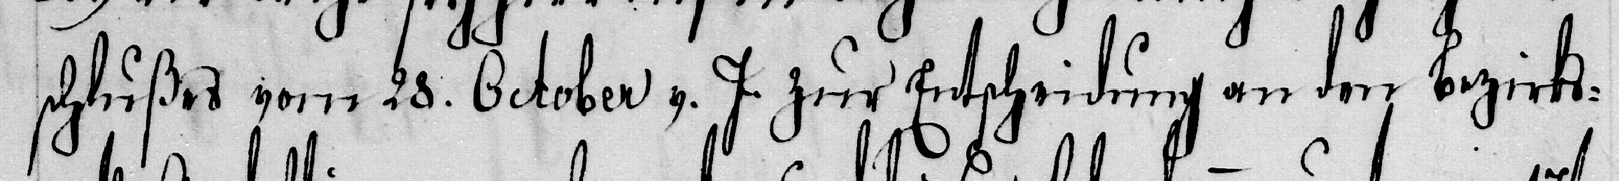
schlußes vom 28. October v. J. zur Entscheidung an den Bezirks¬
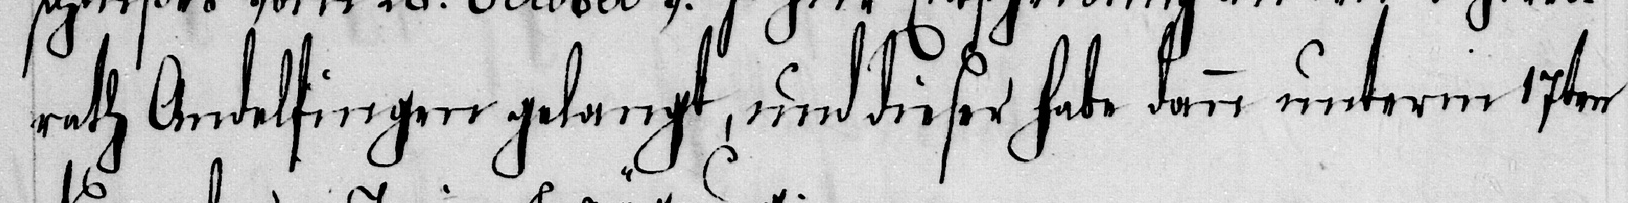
rath Andelfingen gelangt, und dieser habe dann unterm 17ten
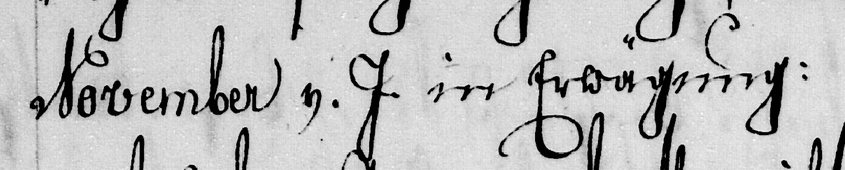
November v. J. in Erwägung:
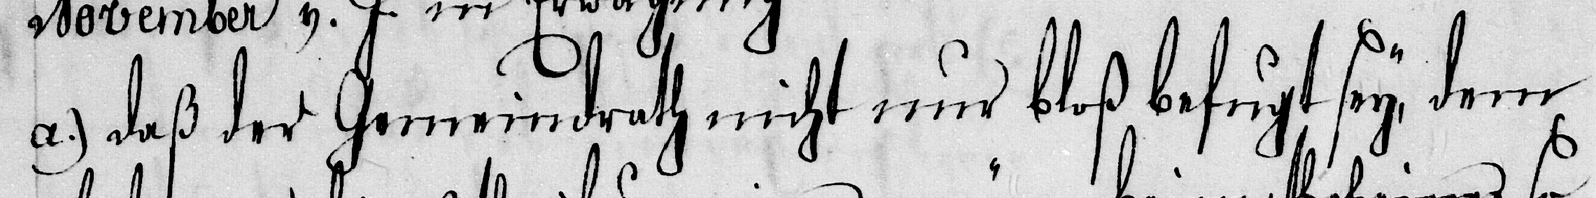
a.) daß der Gemeindrath nicht nur bloß befugt sey, dem
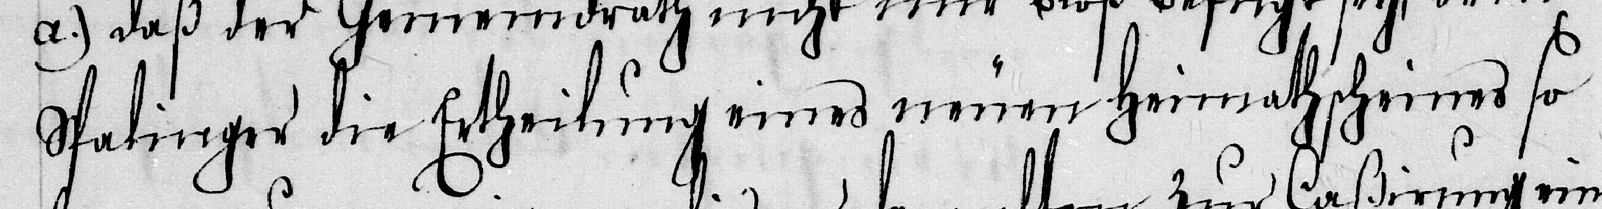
Spalinger die Ertheilung eines neuen Heimathscheines so¬
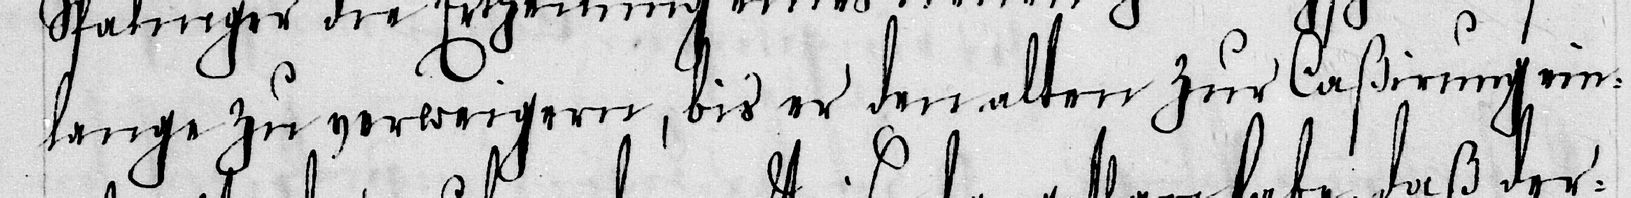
lange zu verweigern, bis er den alten zur Caßirung ein¬
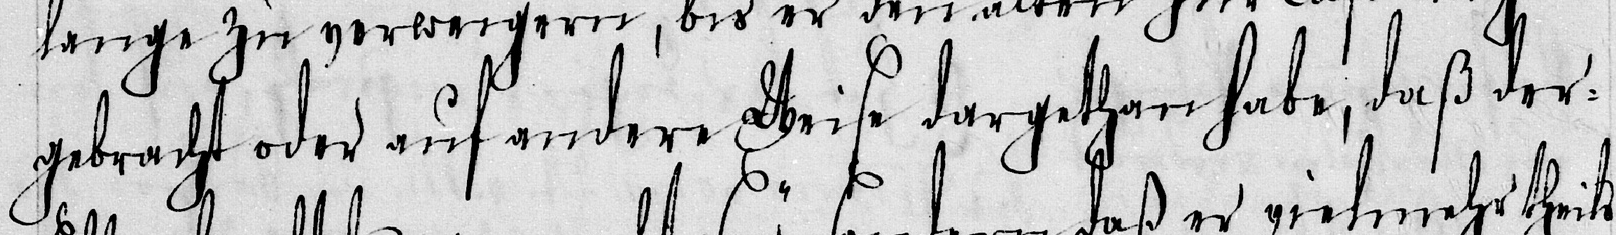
gebracht oder auf andere Weise dargethan habe, daß der¬
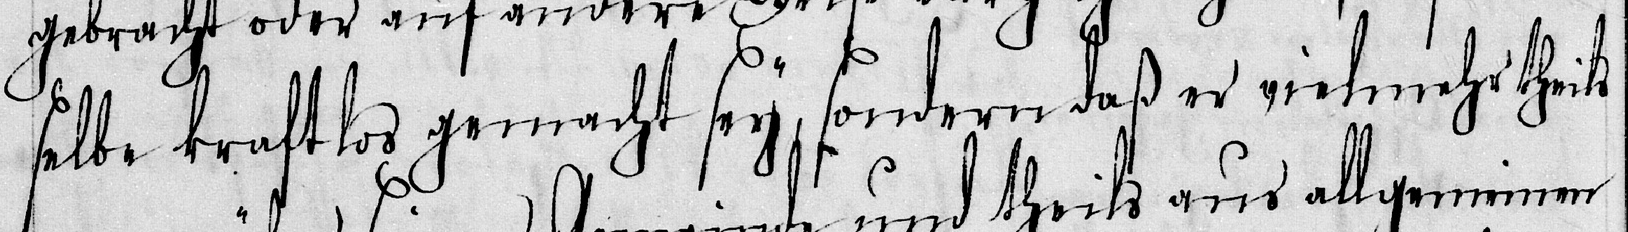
selbe kraftlos gemacht sey, sondern daß er vielmehr theils
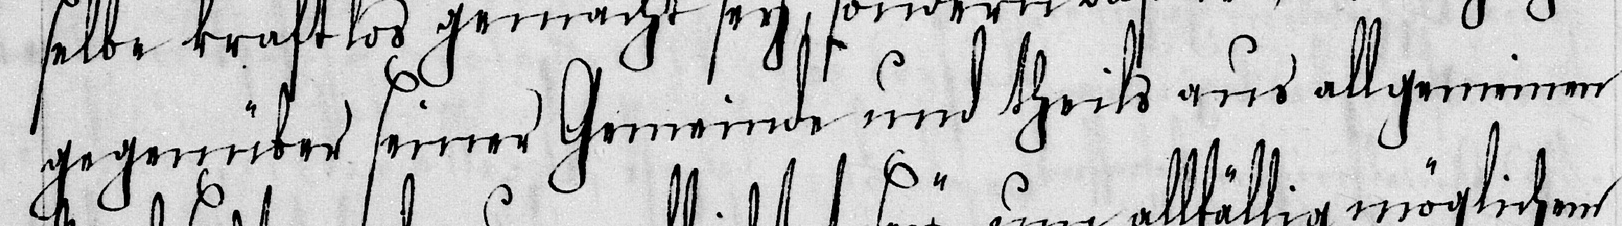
gegenüber seiner Gemeinde und theils aus allgemeinen
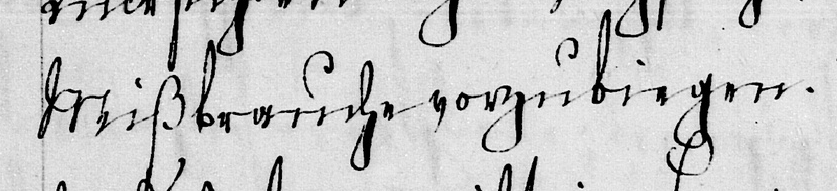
Mißbrauche vorzubiegen
